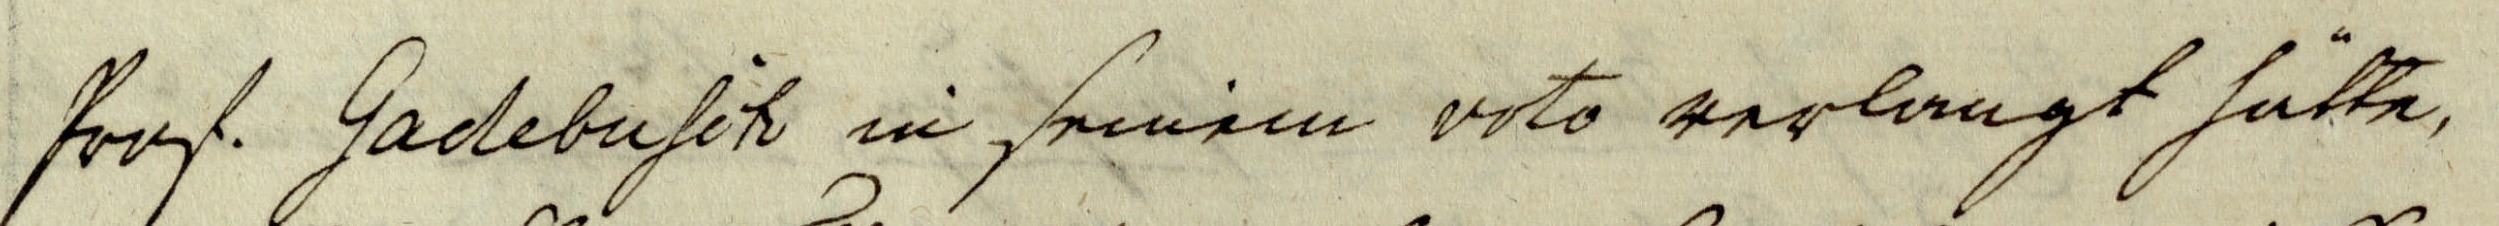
Prof. Gadebusch in seinem voto verlangt hätte,
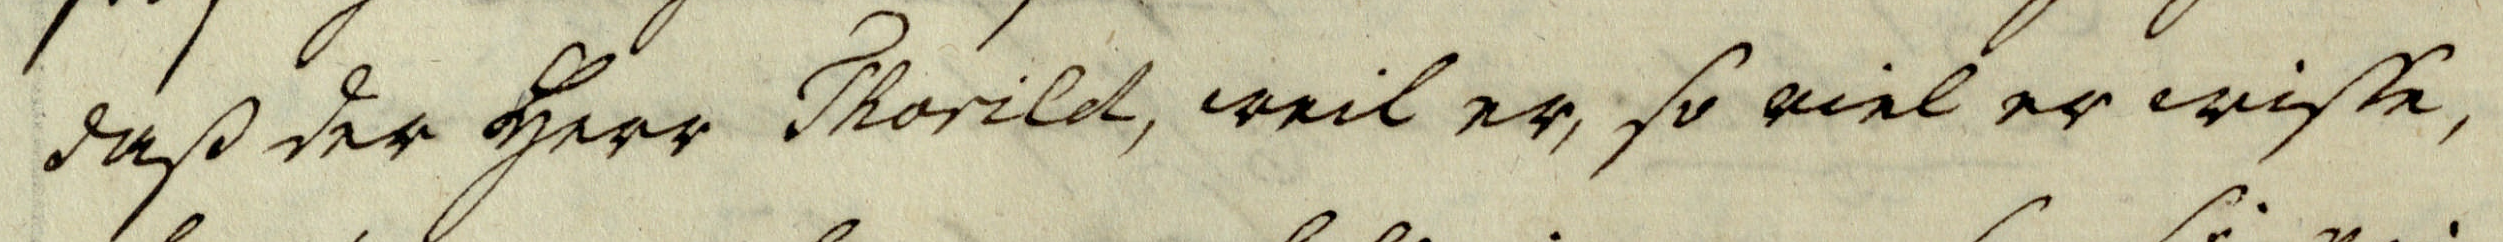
daß der Herr Thorild, weil er, so viel er wisse,
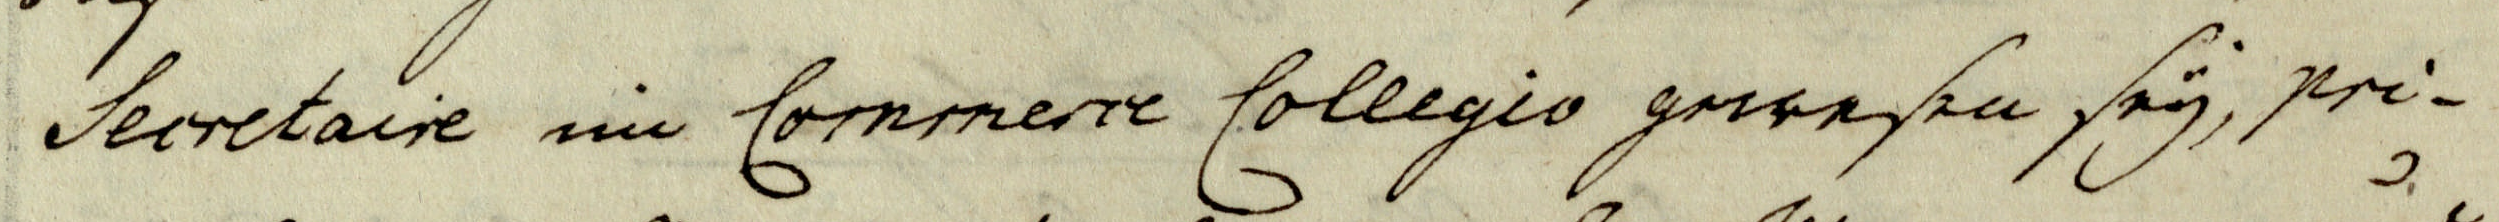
Secretaire im Commerce Collegio gewesen seÿ, pri¬
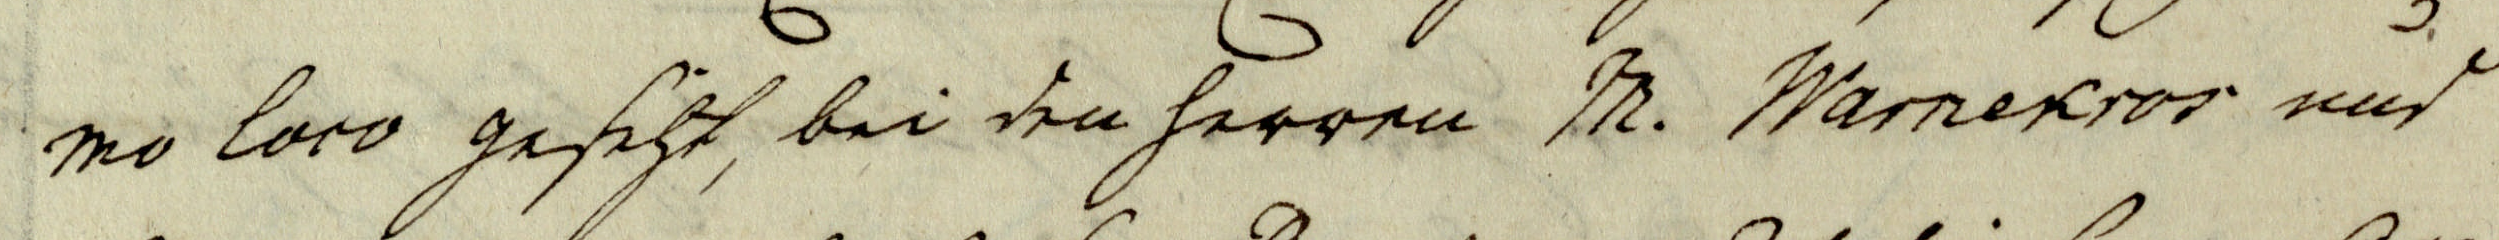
mo loco gesetzt, bei den Herren M. Warneckros und
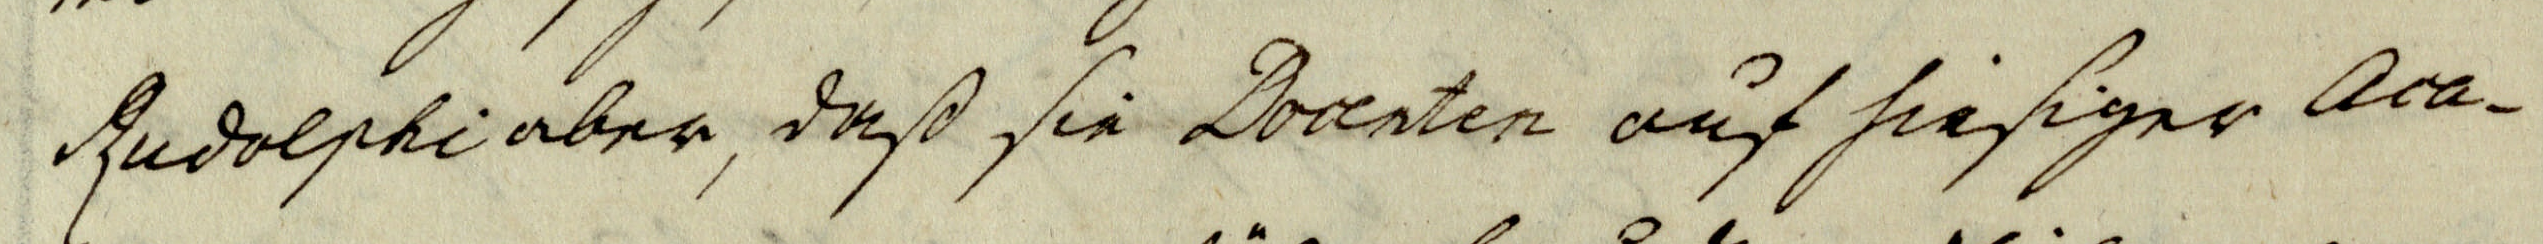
Rudolphi aber, daß sie Docenten auf hiesiger Aca¬
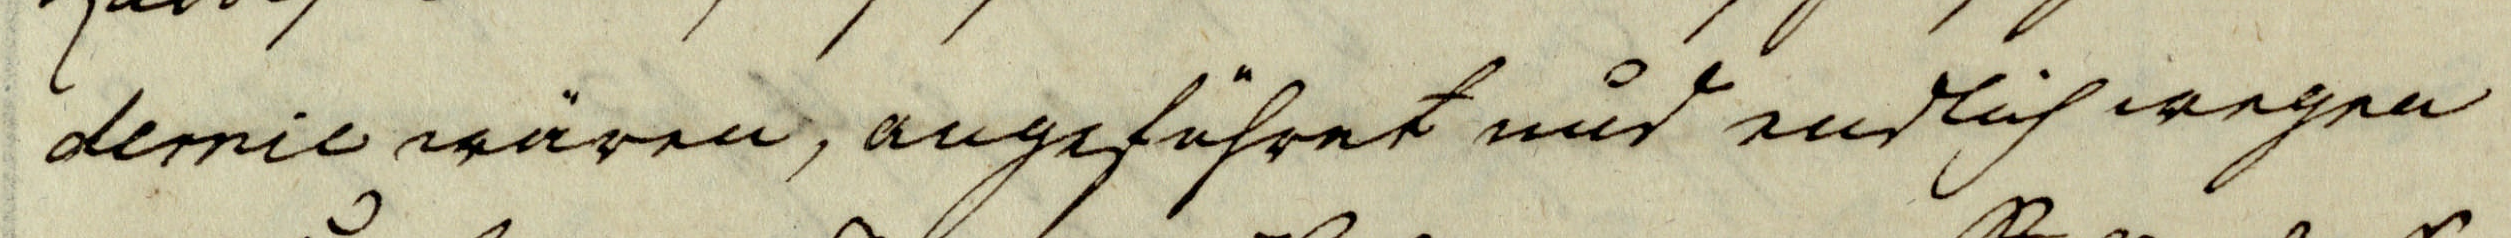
demie wären, angeführet und endlich wegen
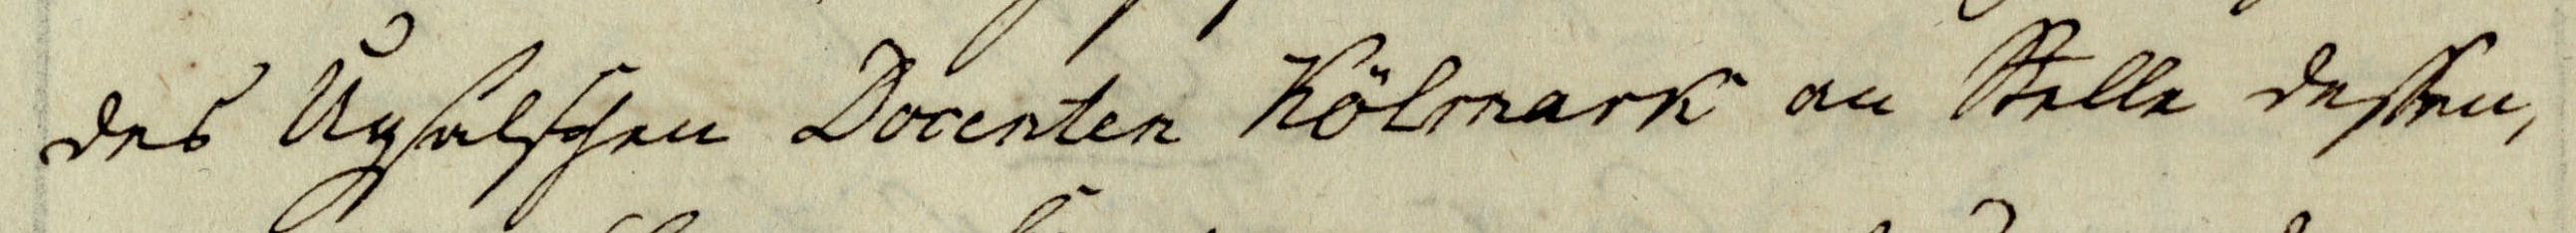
des Upsalschen Docenten Kölmark an Stelle dessen,
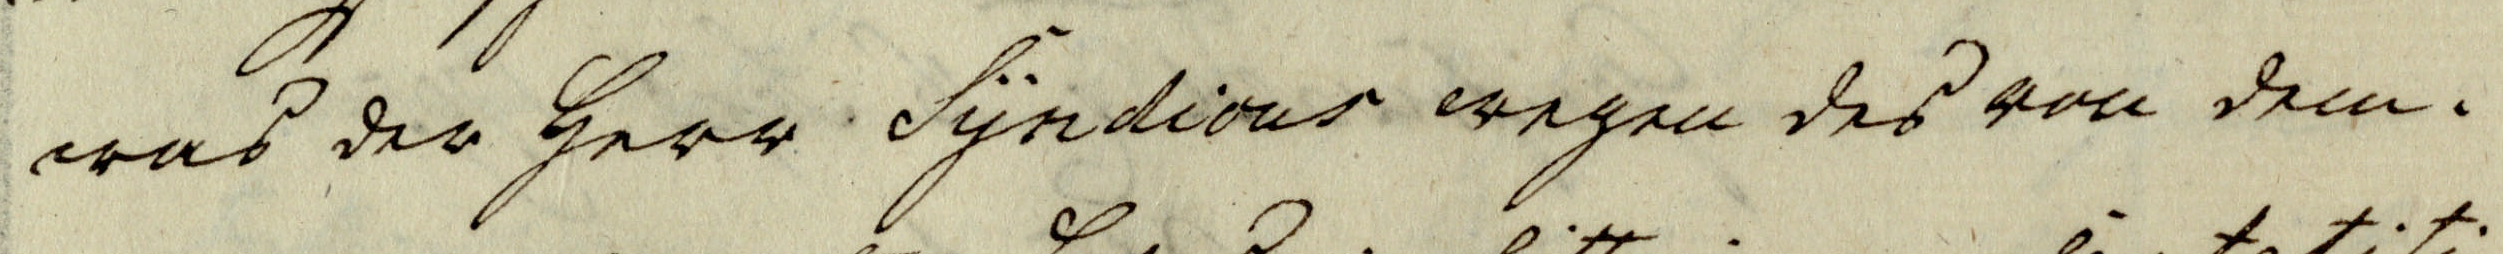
was der Herr Sÿndicus wegen des von dem¬
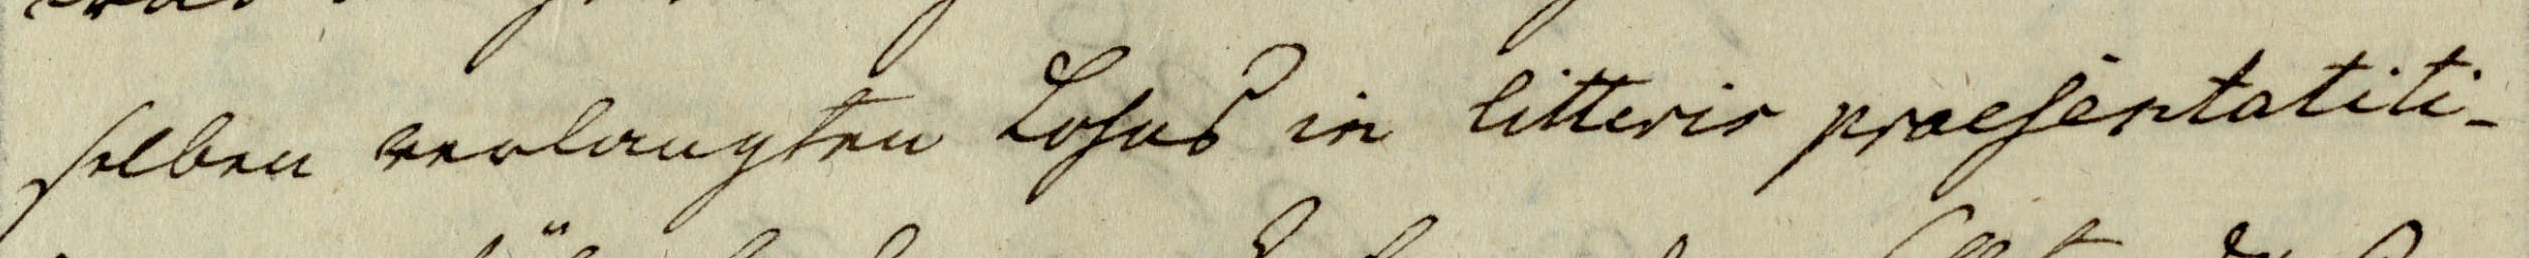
selben verlangten Lohns in litteris praesentatiti¬
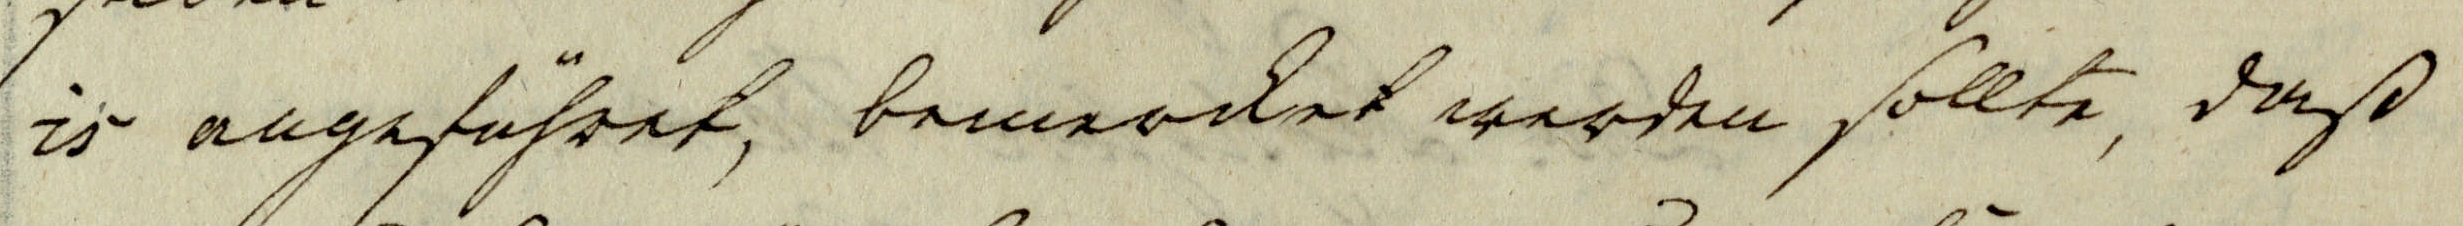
is angeführet, bemercket werden sollte, daß
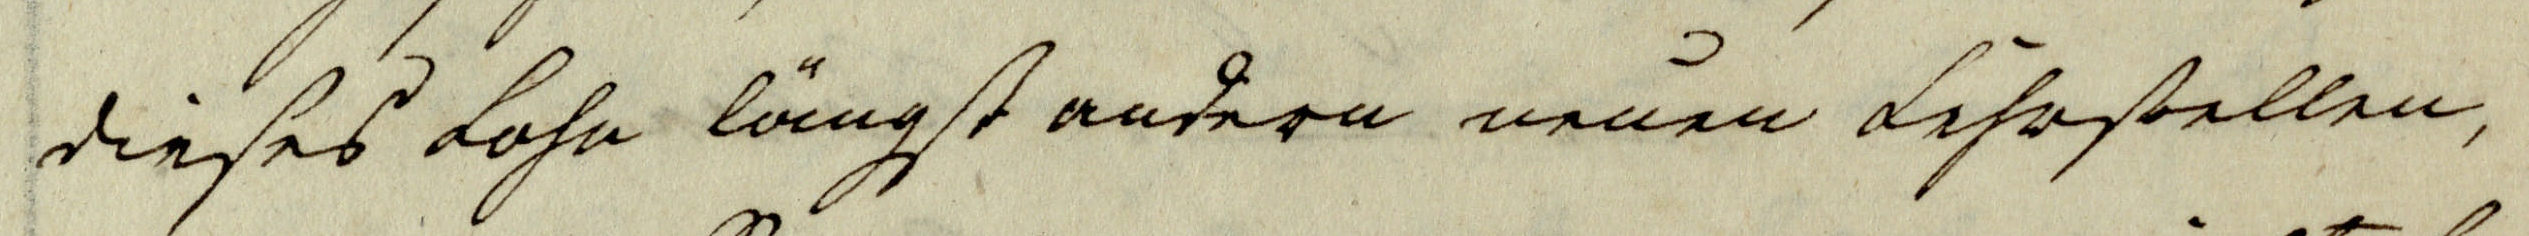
dieses Lohn längst andern neuen Lehrstellen,
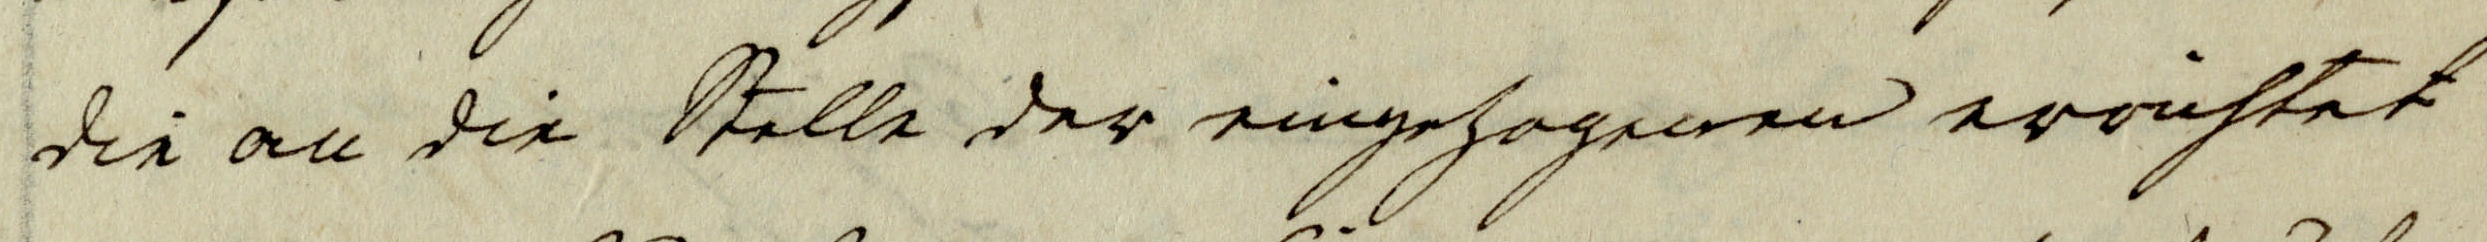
die an die Stelle der eingezogenen errichtet
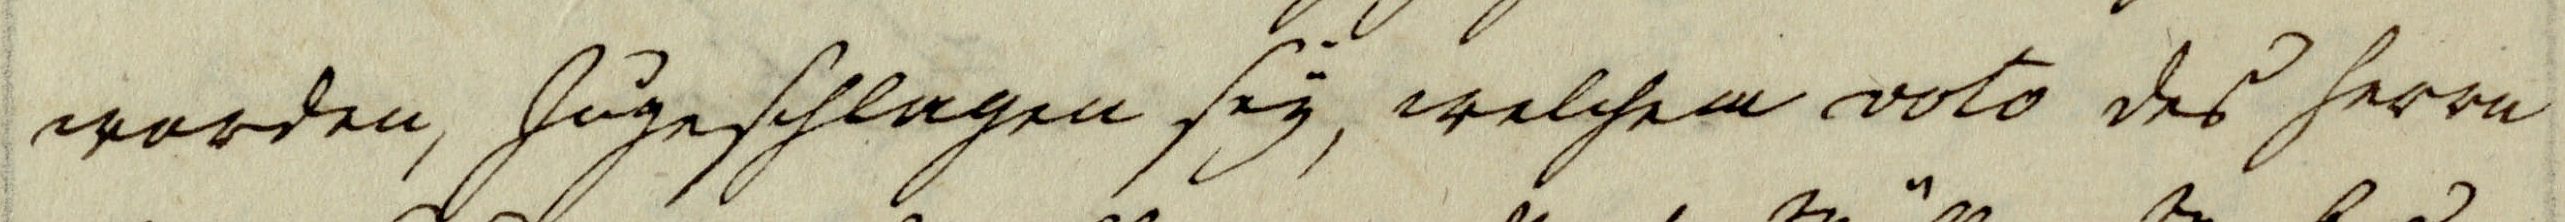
worden, zugeschlagen seÿ, welchem voto des Herrn
